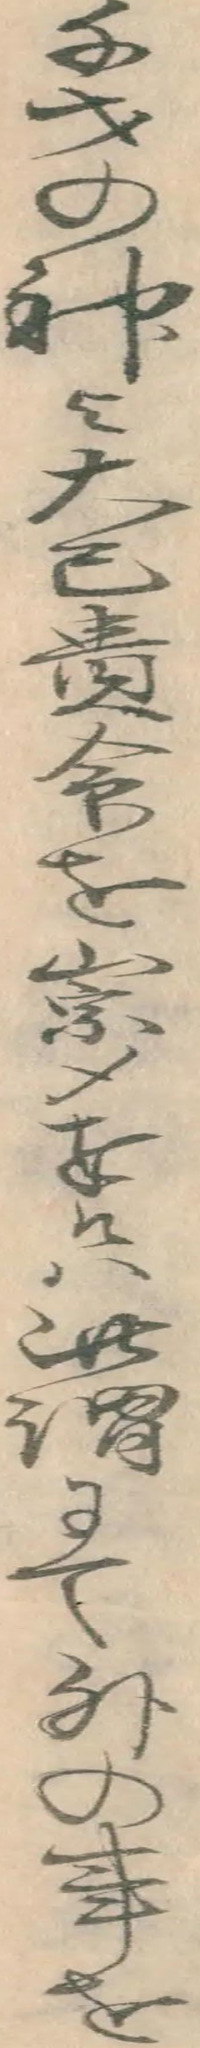千才の神と大己貴命を崇め奉れは此謂にて外の事を
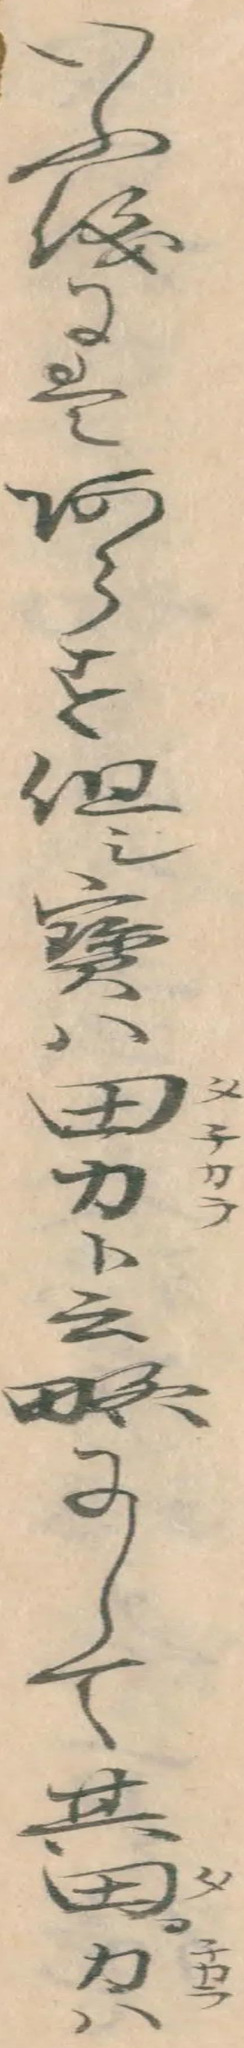いふ儀にはあらす但し宝は田力と云略にして其田。力は
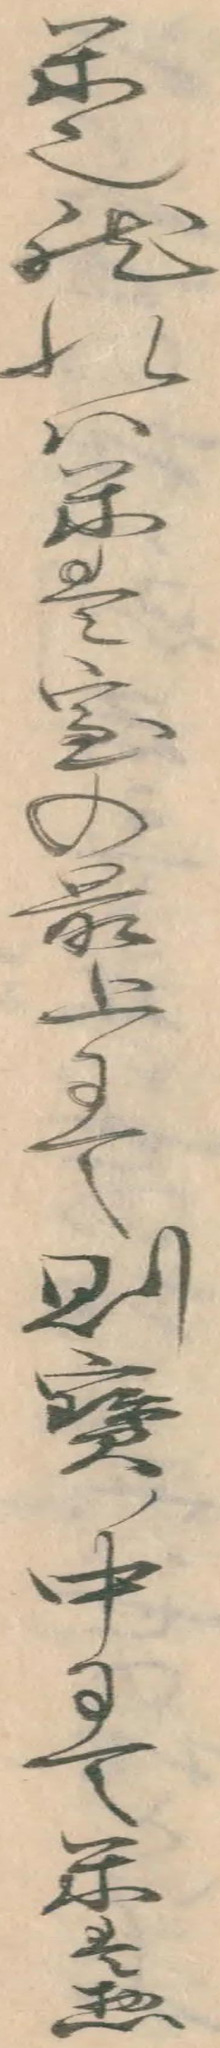米也然れは米は宝の最上にて則宝の中にて米は惣
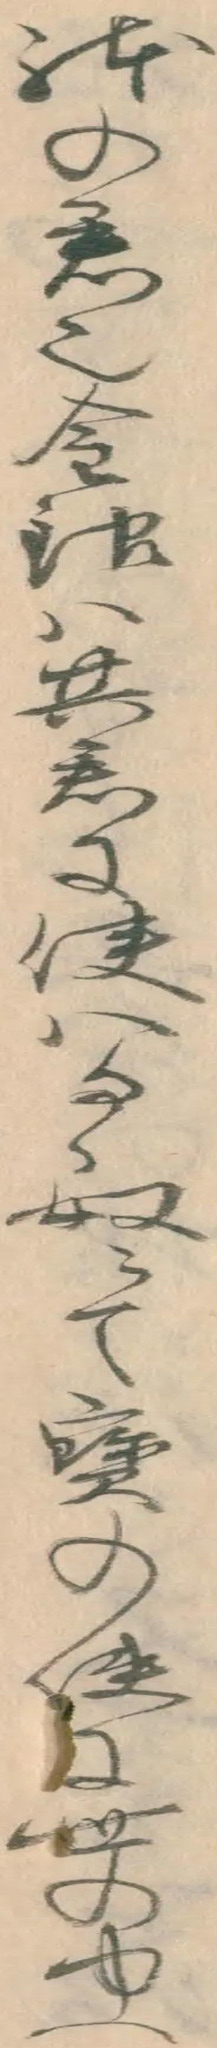体の君也金銀は其君に使はるゝ奴にて宝の使に世の中へ
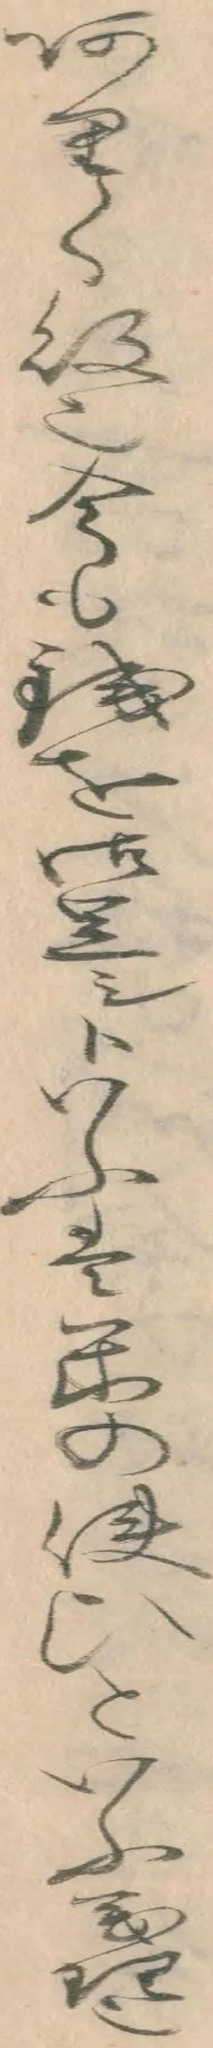ありく役也今も銭を御足しといふは米の使ひといふ義理也
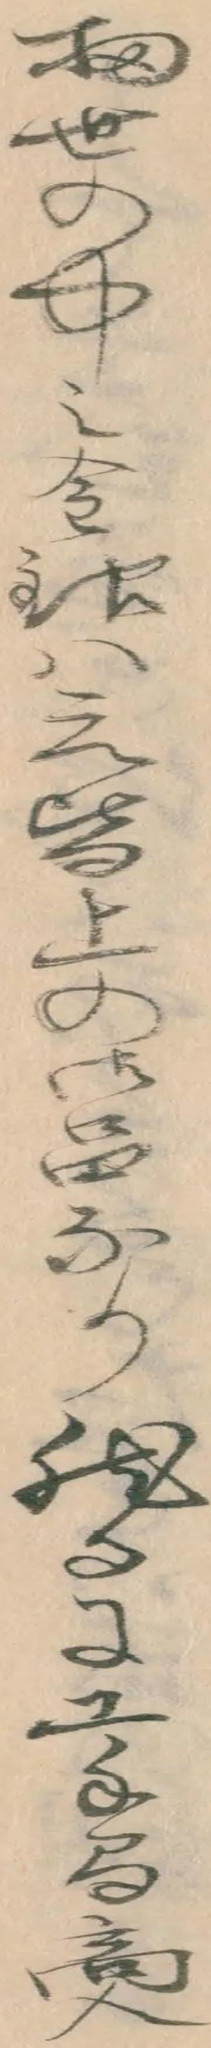扨世の中之金銀は元皆上の御品なり然るに工手間商人
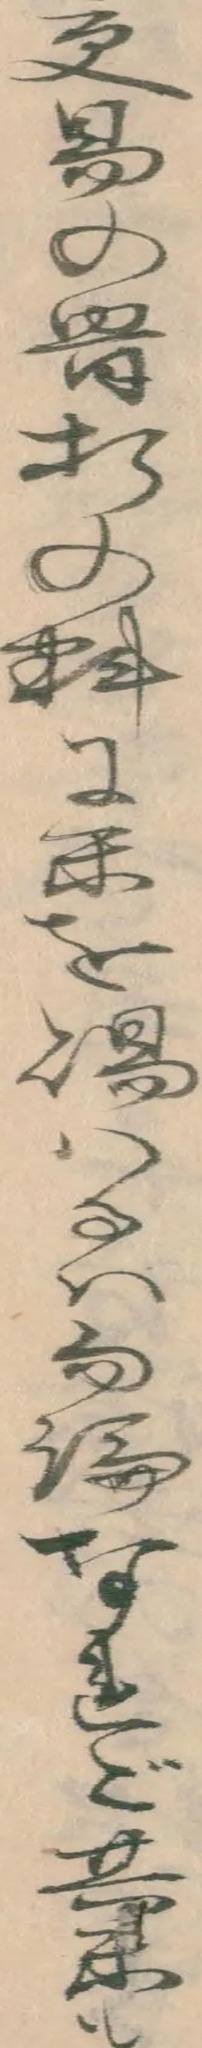交易の骨折の料に米を賜はるは勿論なれど其米も
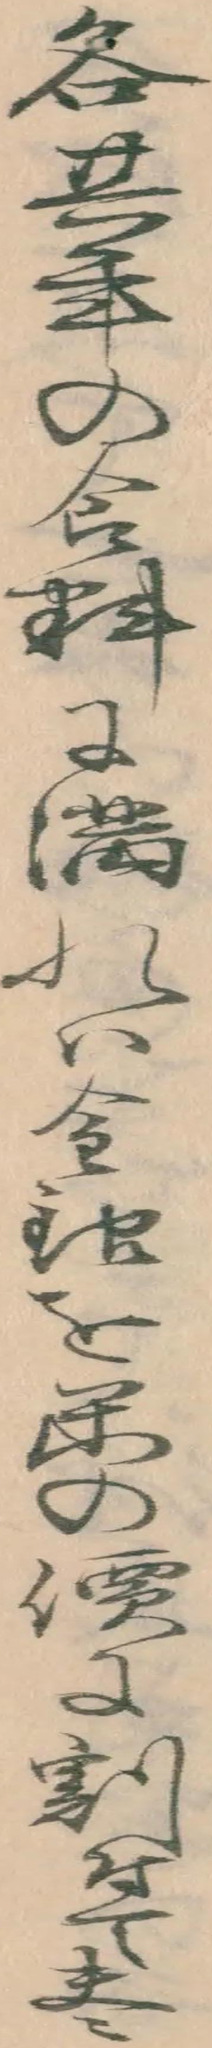各其年の食料に満れは金銀を米の価に割付て夫々
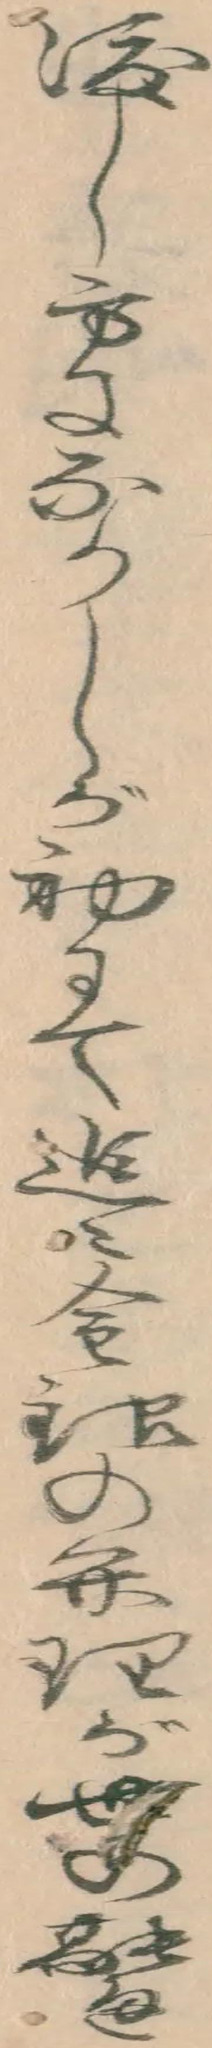渡し方になりしが初にて追々金銀の弁理が世の融通
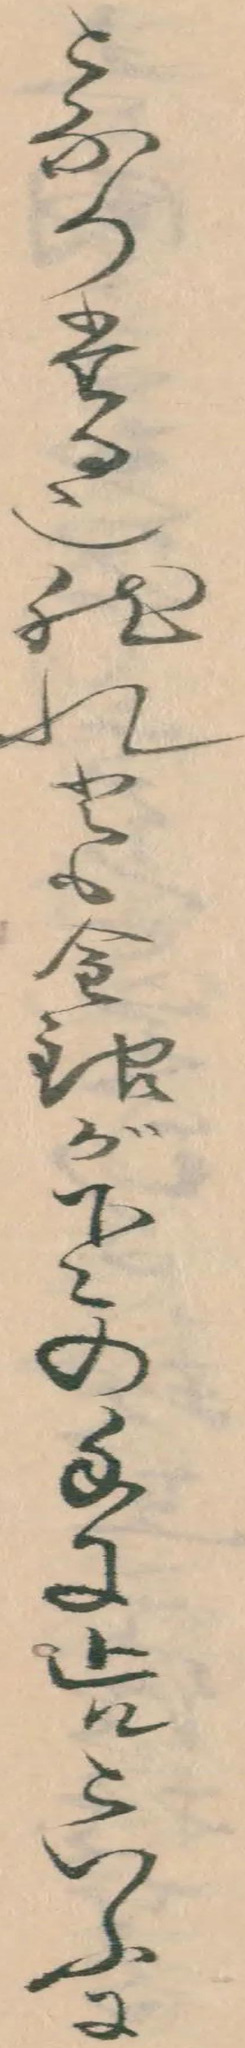となりたる也然れとも金銀が下々の手に止るといふに
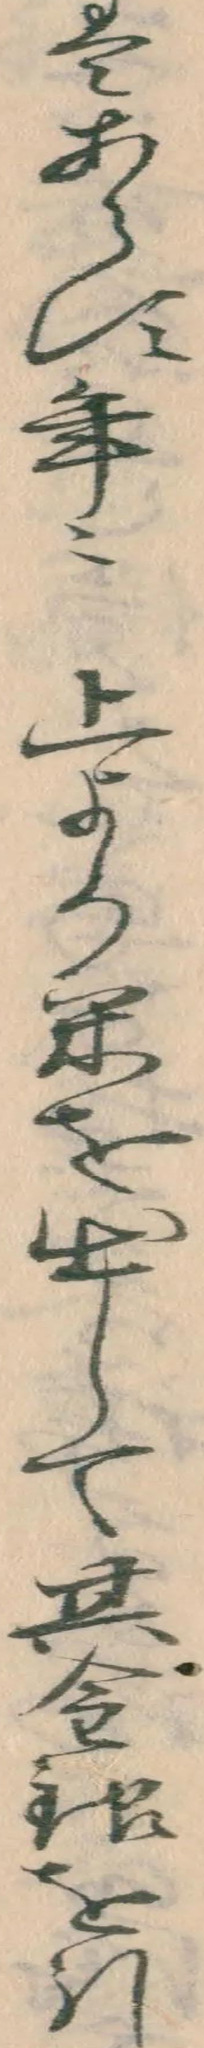はあらす年々上より米を出して其金銀を引
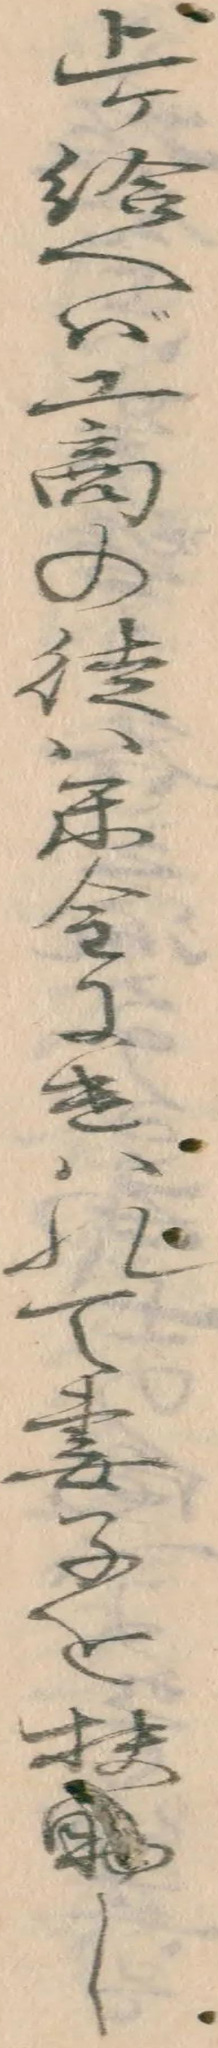上け給へば工商の徒は米金に遣はれて妻子を扶助し
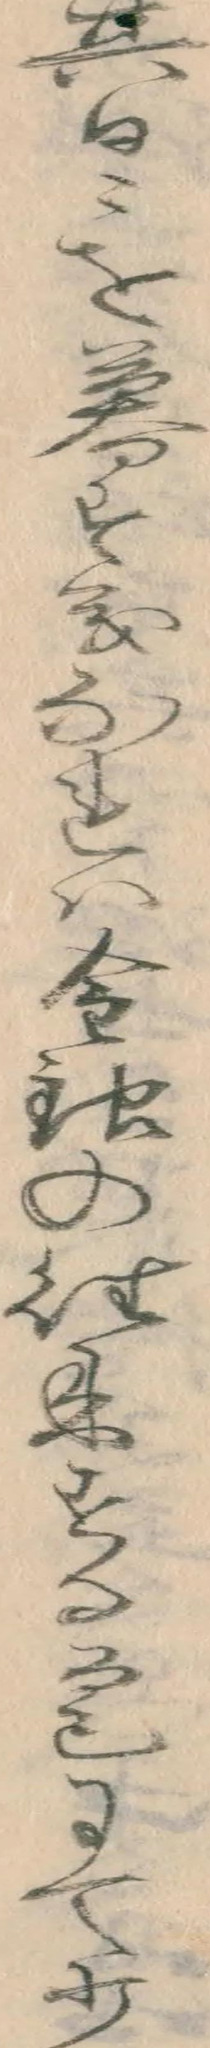其日々を暮す義なれは金銀の往来する而已にて少
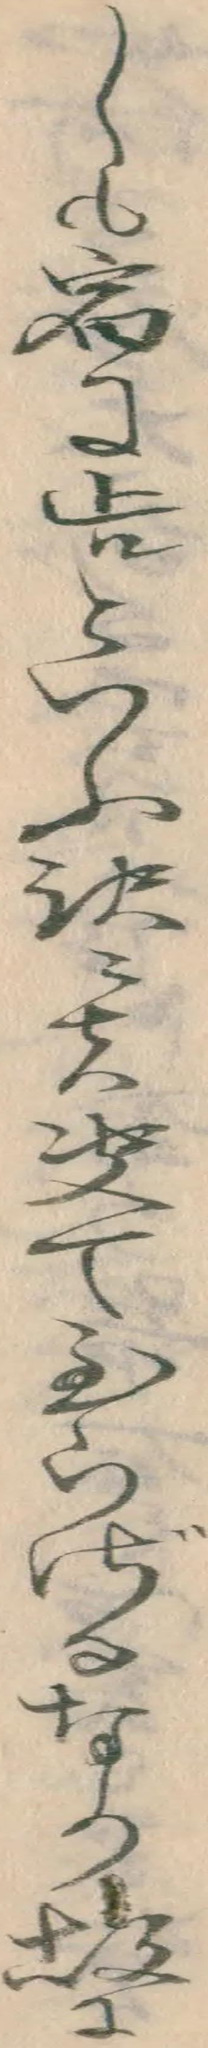しも宿に止るといふ訳に者決て至らざるなり故に
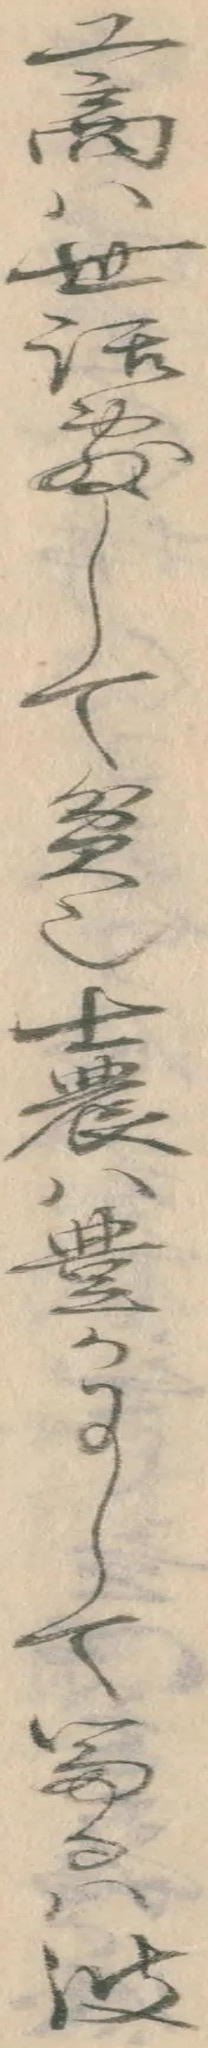工商は世話敷して貧也士農は豊かにして富るは彼
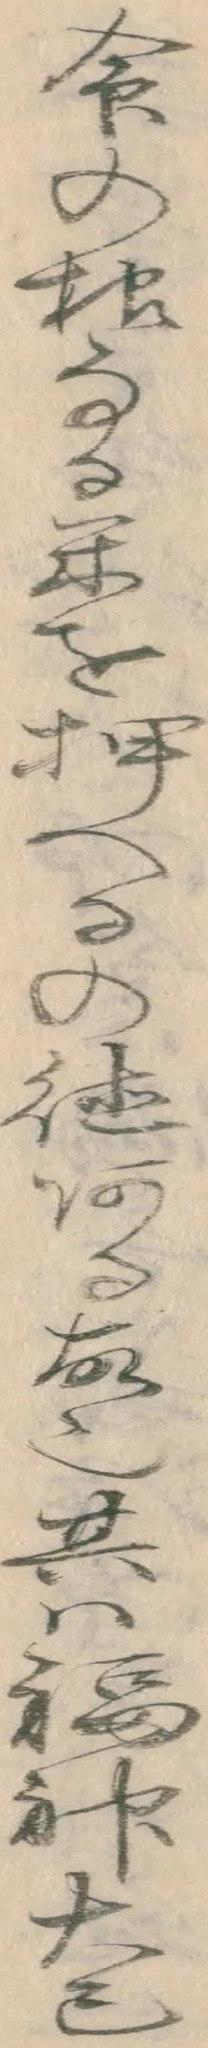命の根なる米を押へるの徳ある故也其は福神大己
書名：斎庭之穂
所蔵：国立国会図書館 National Diet Library, JAPAN
